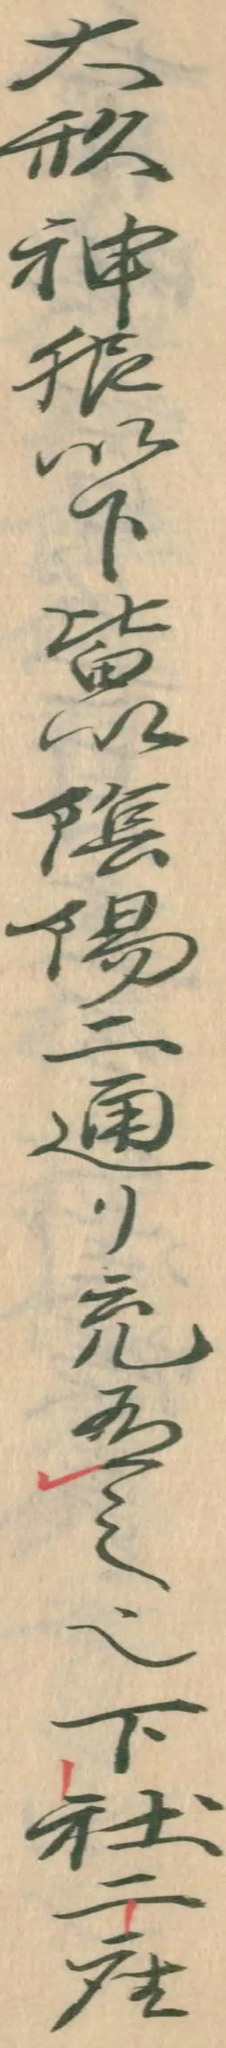大形神服以下皆以陰陽二通リ充有之也下_社二-座
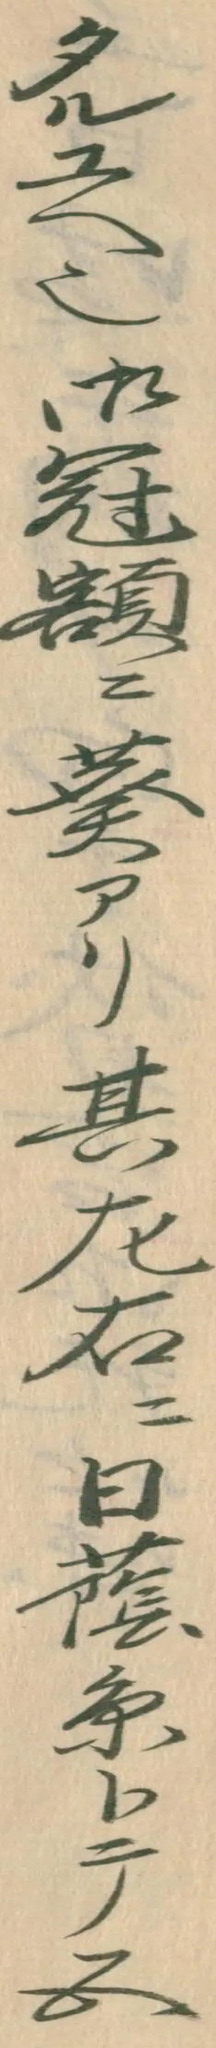タルユヘ也御冠額ニ葵アリ其左右ニ日蔭糸トテ五
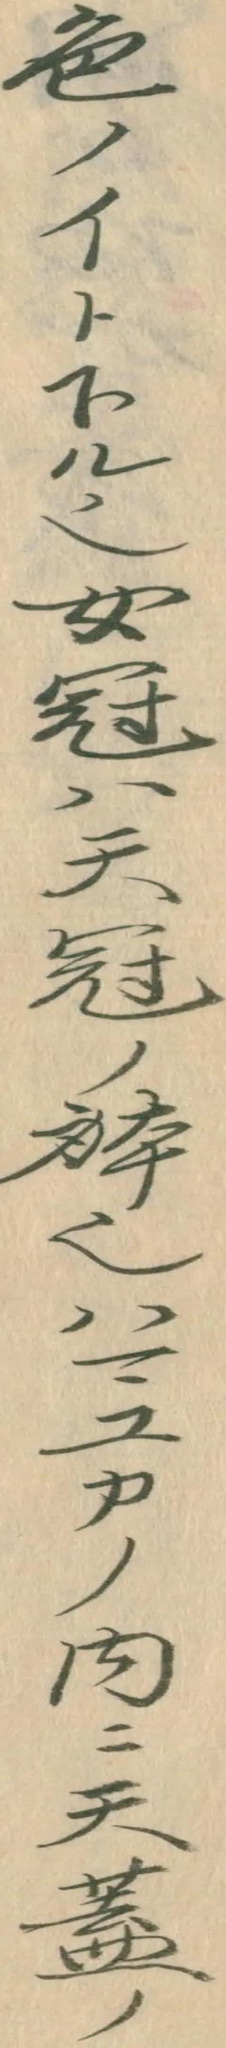色ノイト下ル也女冠ハ天冠ノ体也ハマユカノ内ニ天蓋ノ
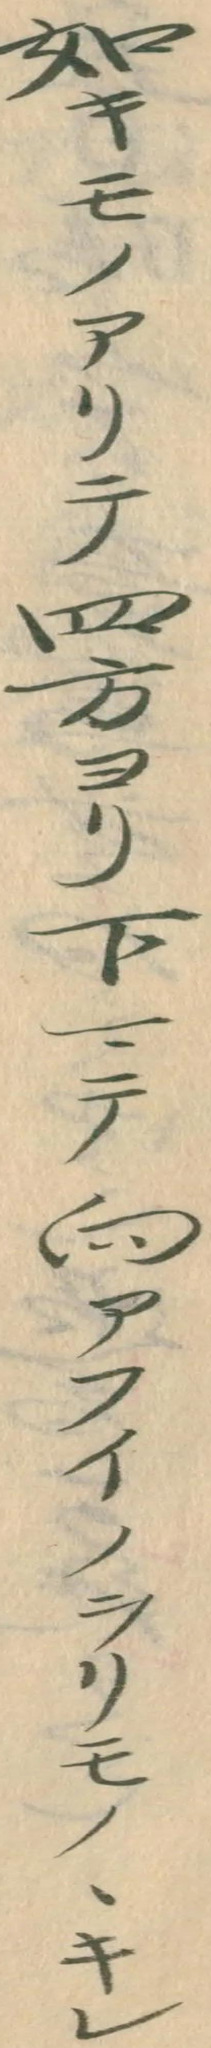如キモノアリテ四方ヨリ下マテ向アフイノヲリモノヽキレ
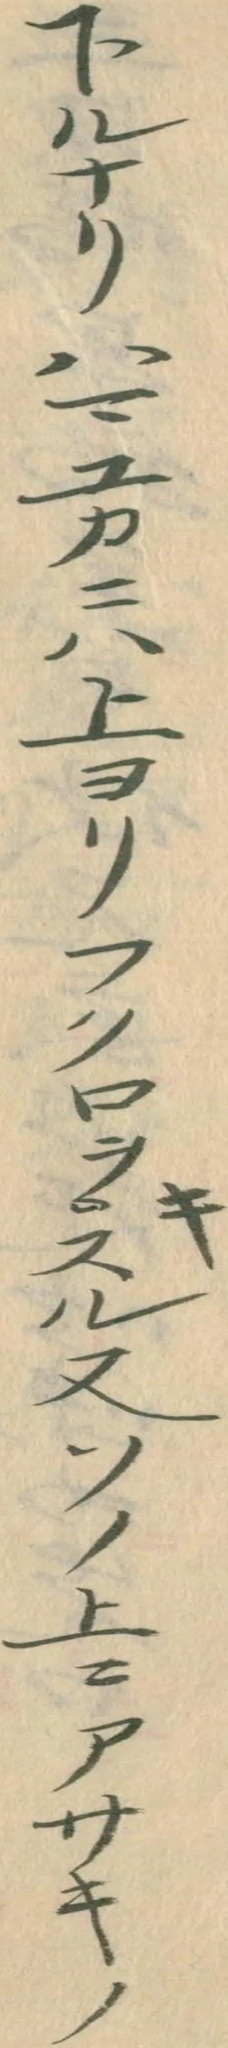下ルナリハマユカニハ上ヨリフクロヲ￮スル又ソノ上ニアサキノ
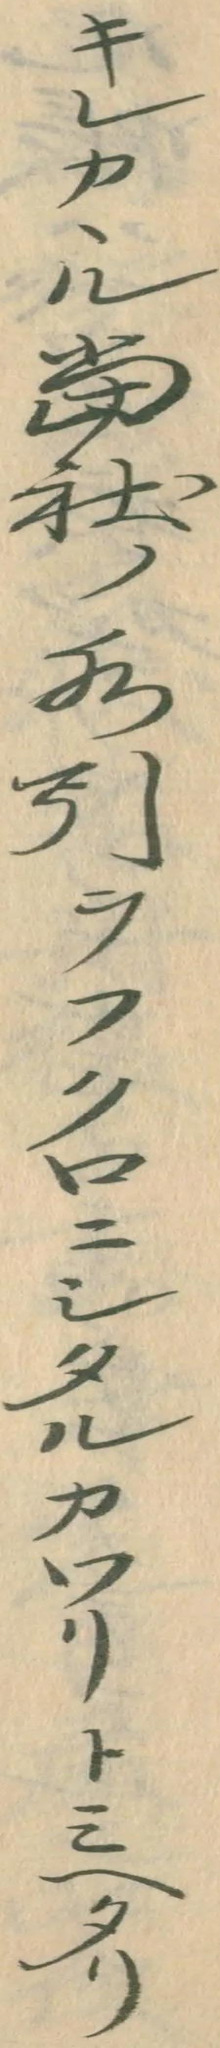キレカヽル当社ノ水引ヲフクロニシタルカワリトミヘタリ

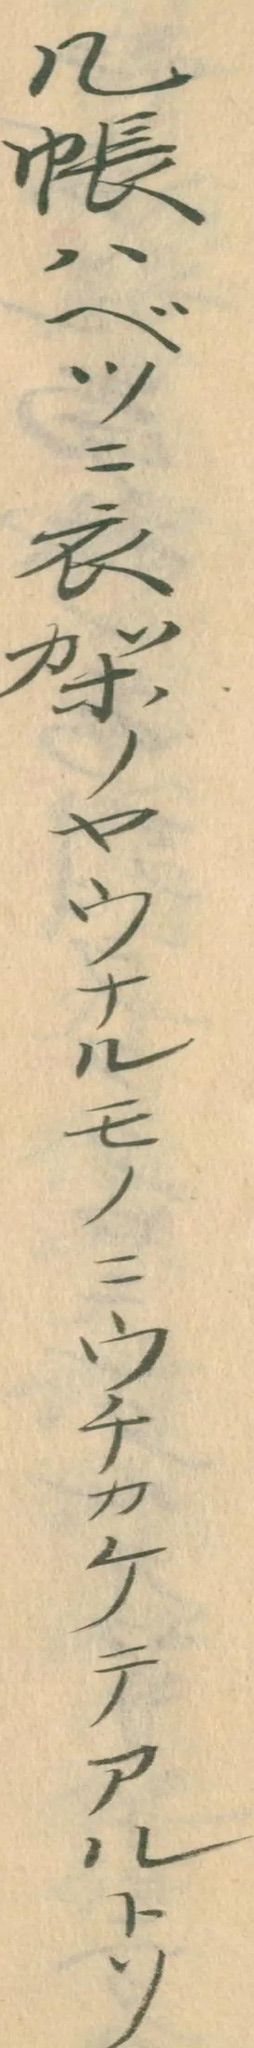几帳ハベツニ衣架ノヤウナルモノニウチカケテアルトソ
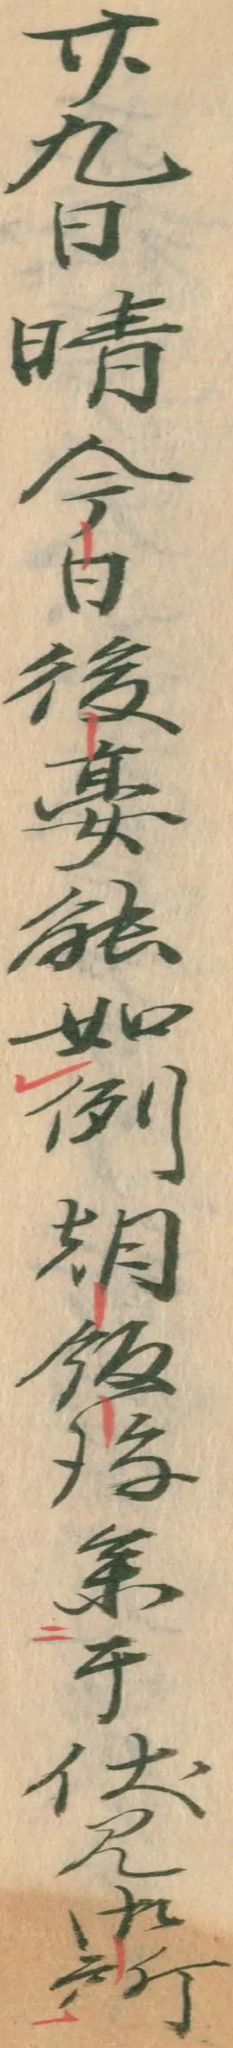廿九日晴今-日後-宴能如例朝-飯-後参于伏見御-所
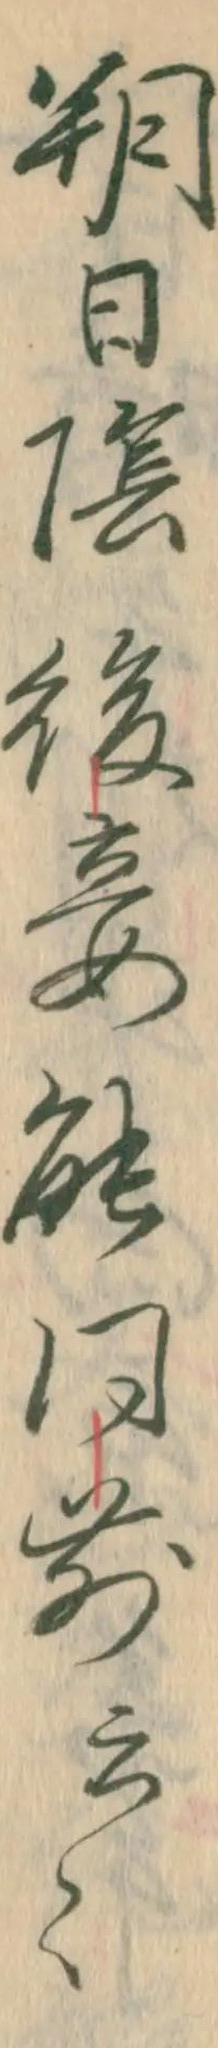朔日陰後-宴能同-前云々
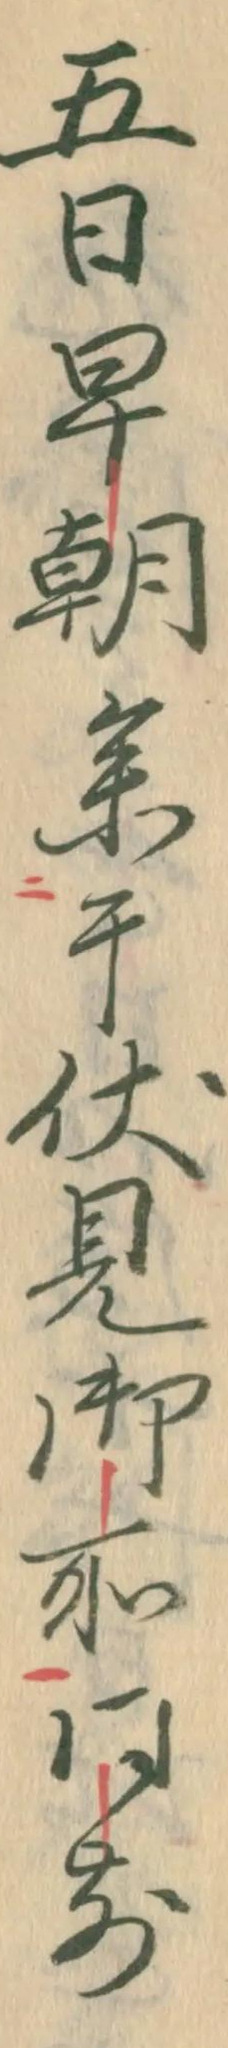五日早-朝参于伏見御-所同-前
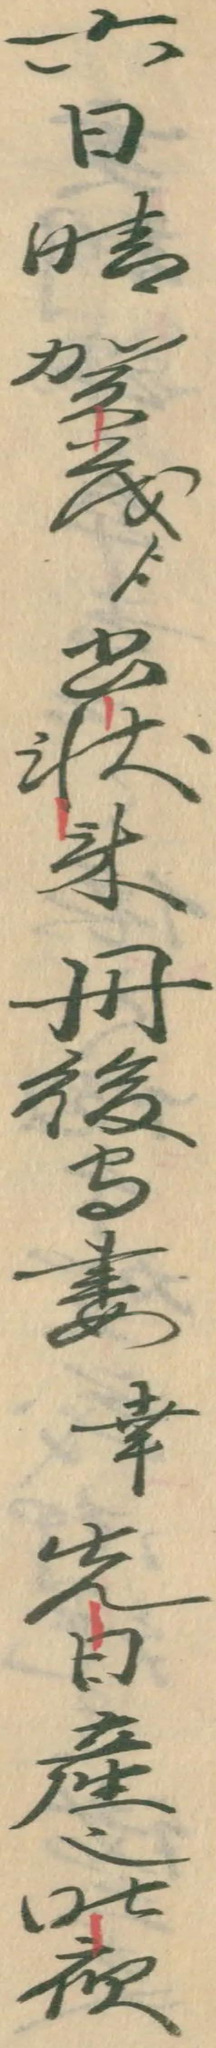六日晴賀-茂ゟ書-状_来丹後守妻幸先-日産也昨-夜

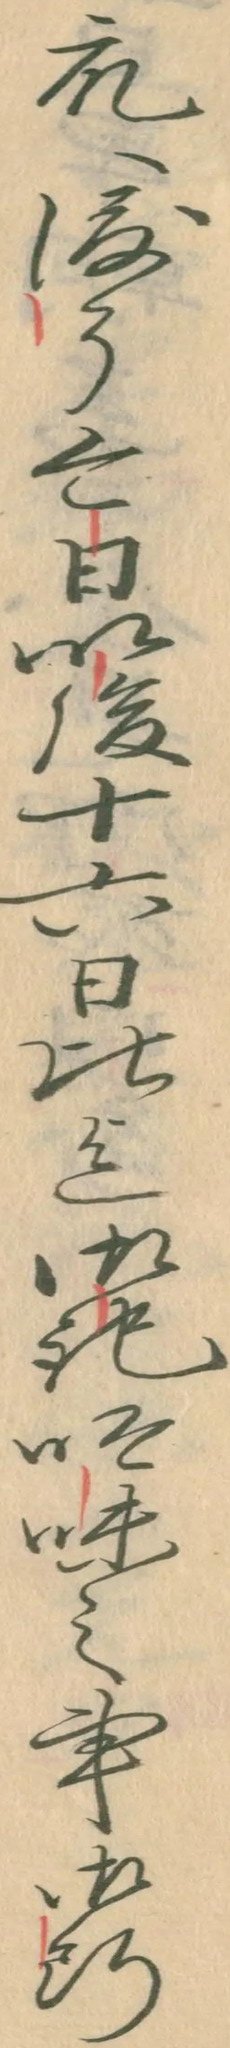衆へ渡_了今-日以-後十六日比迄御-記吟-味之事御_断
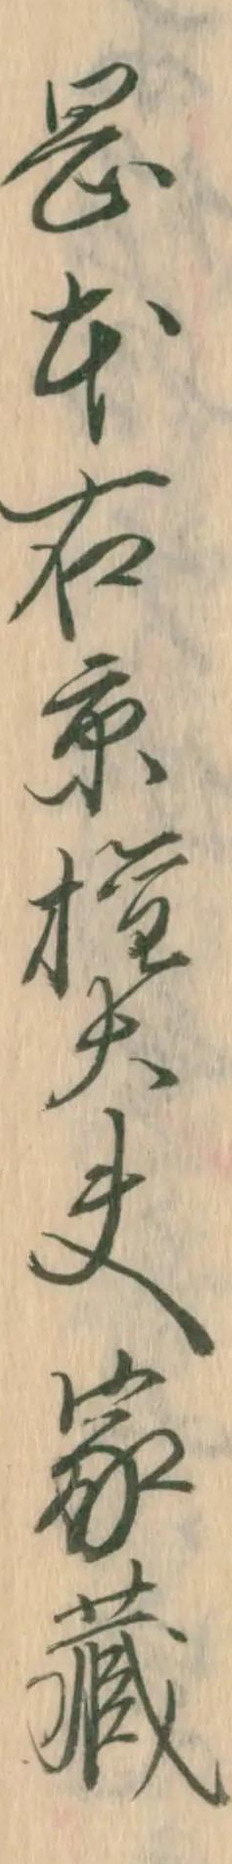岡本右京権大夫家蔵
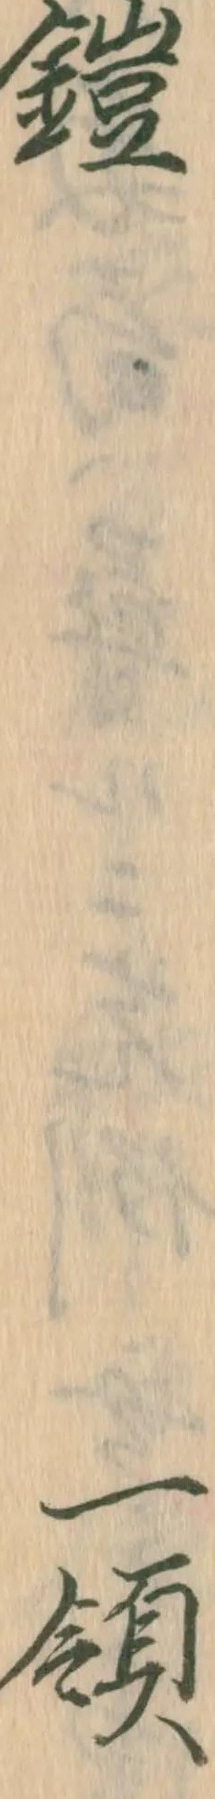鎧一領
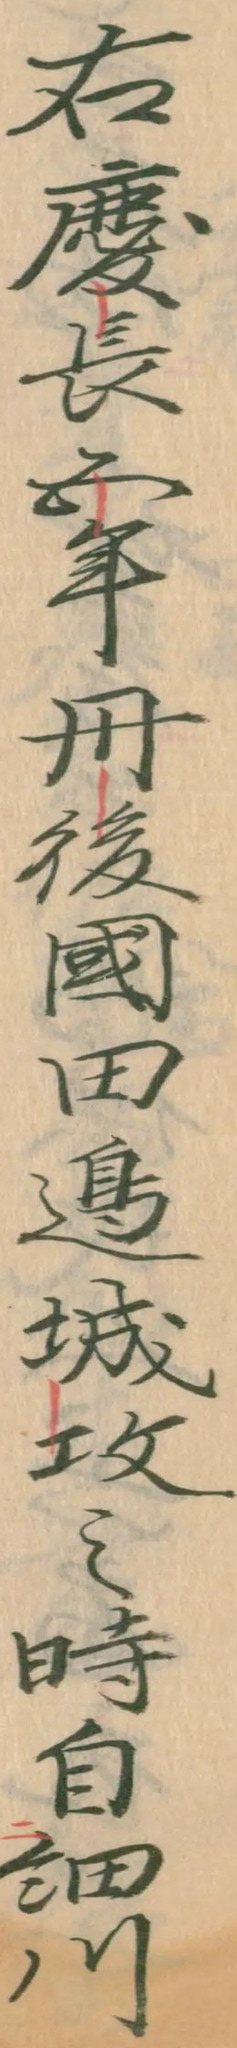右慶-長五-年丹-後国田辺城_攻之時自細川
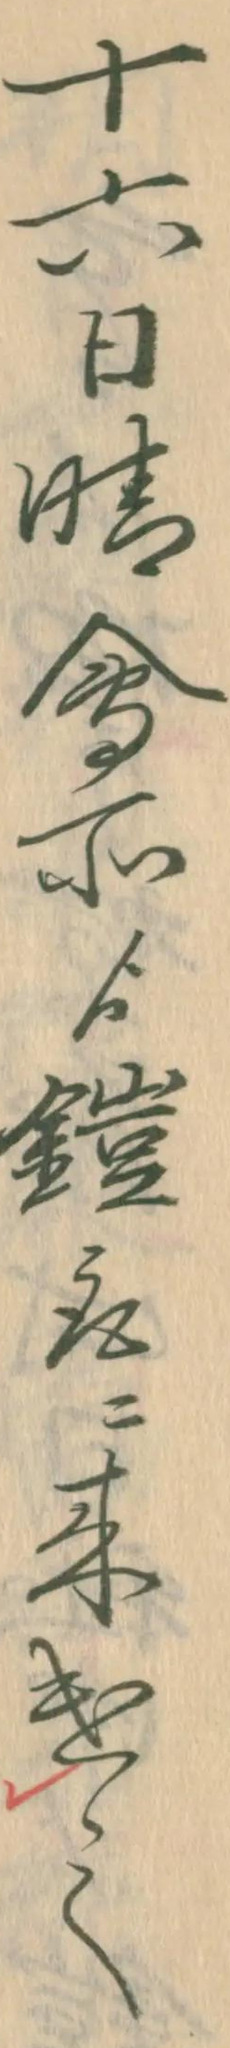十六日晴会所ゟ鎧取ニ来遣之
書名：賀茂社記録. 第16冊
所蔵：国立国会図書館 National Diet Library, JAPAN
